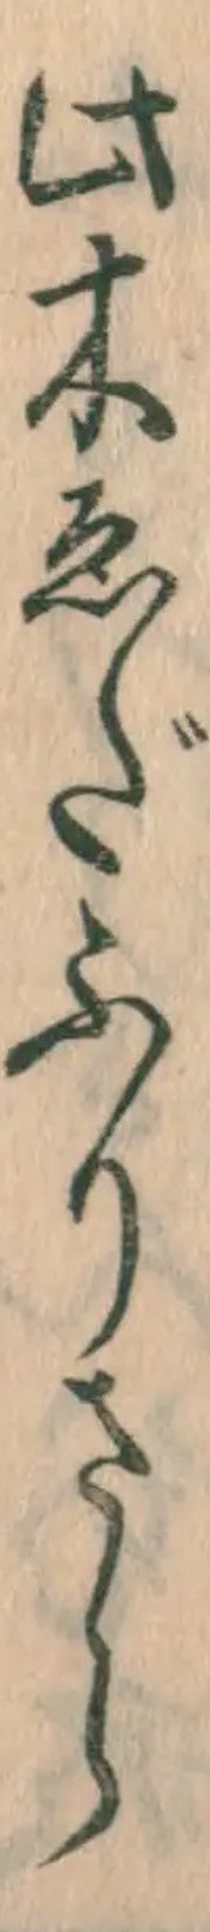此木ゑだふりさら
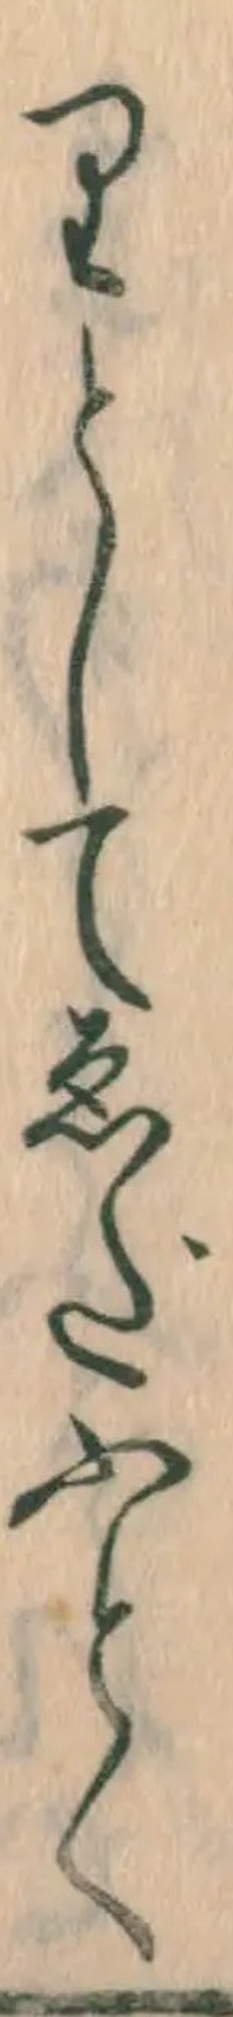りとしてゑだふとく
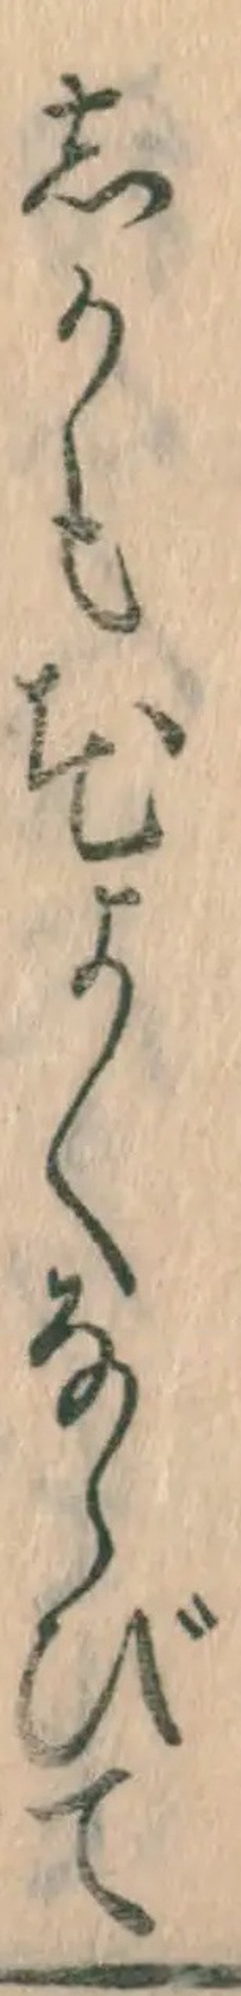しかも花よくならびて
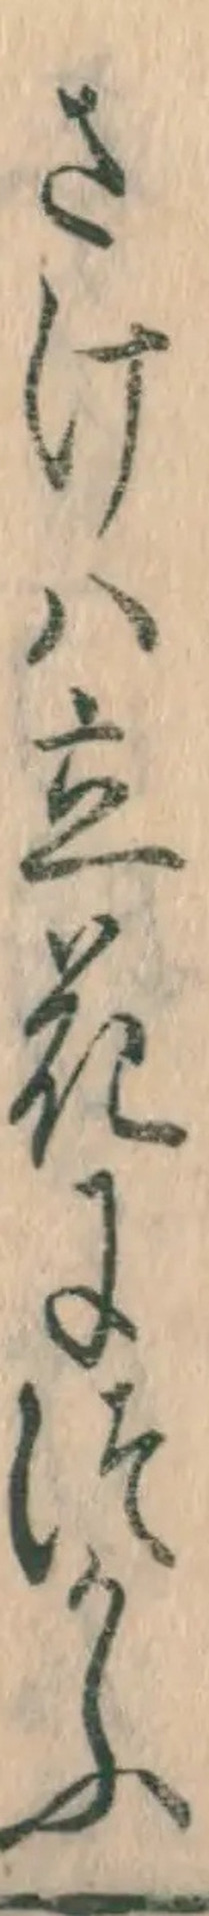さけは立花につかふ
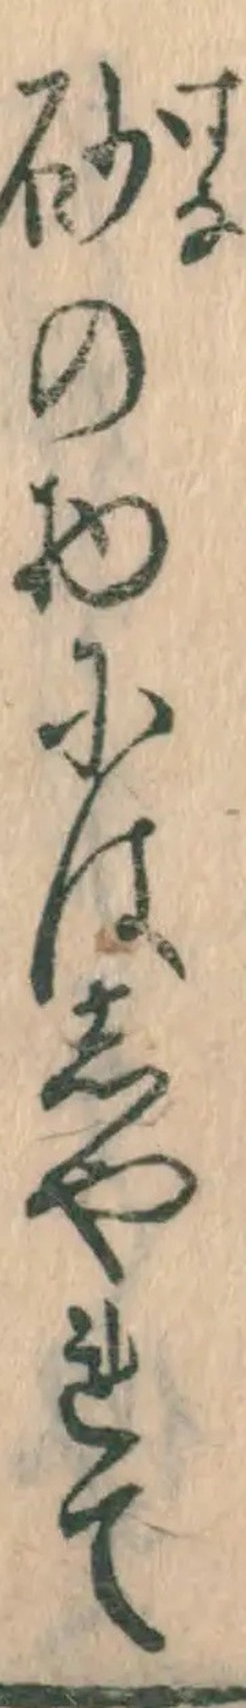砂の物にはしやれて
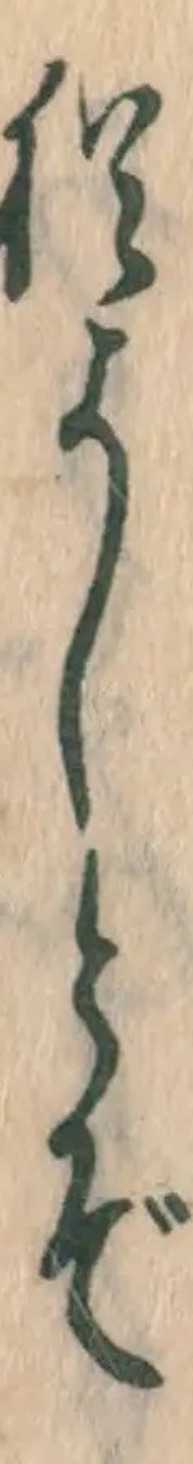程よしとぞ

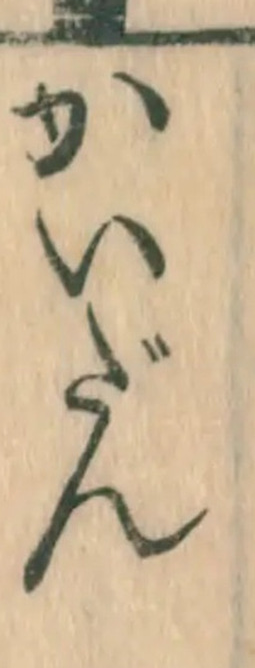かいだん
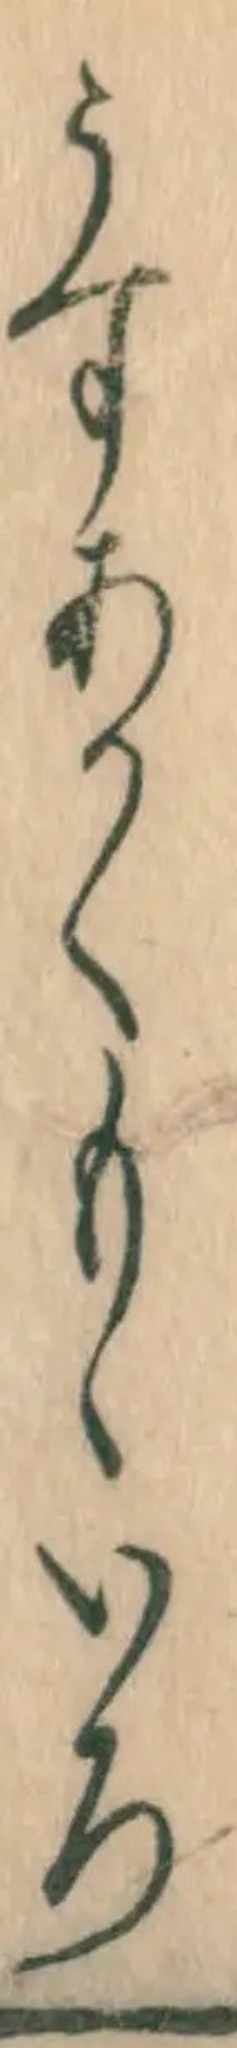うすあかくもゝいろ
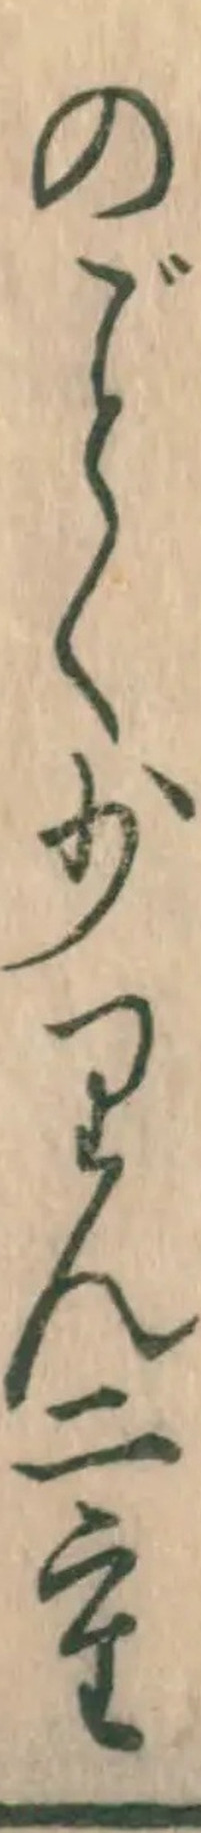のごとく少りん二重
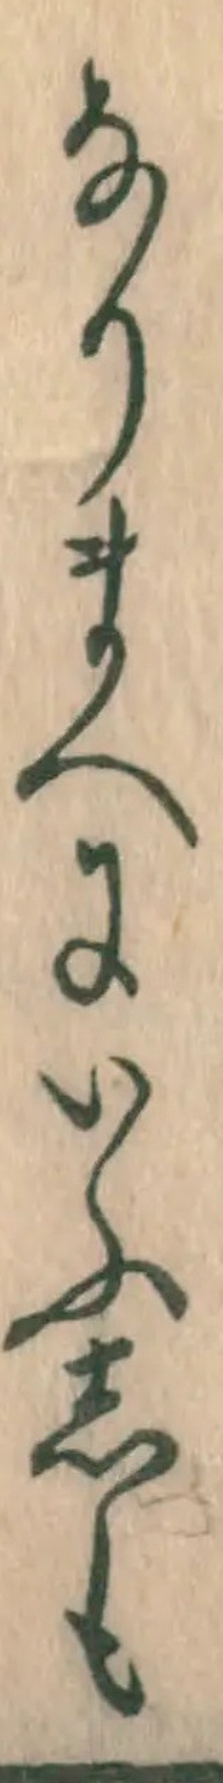なりまへにいふしも
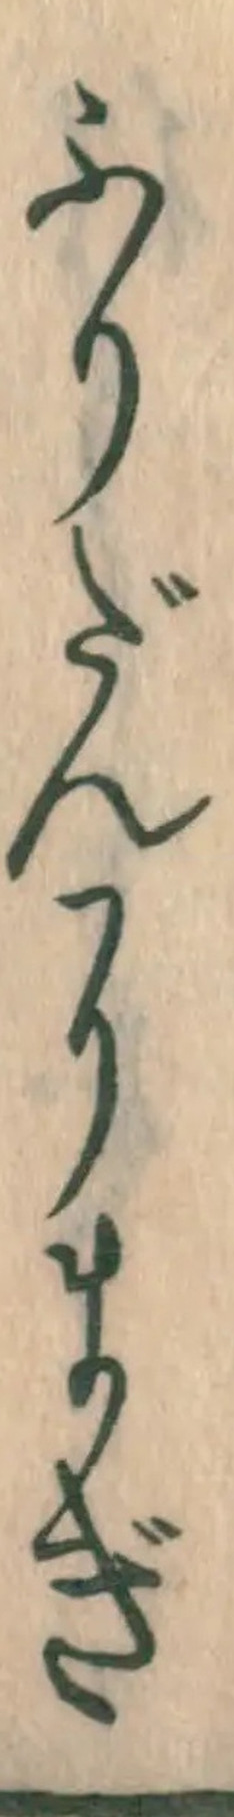ふりだんにまぎ
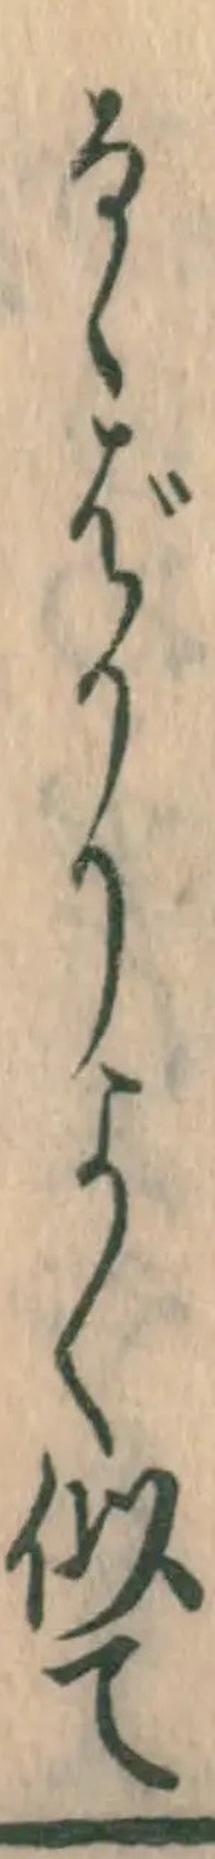るゝばかりよく似て
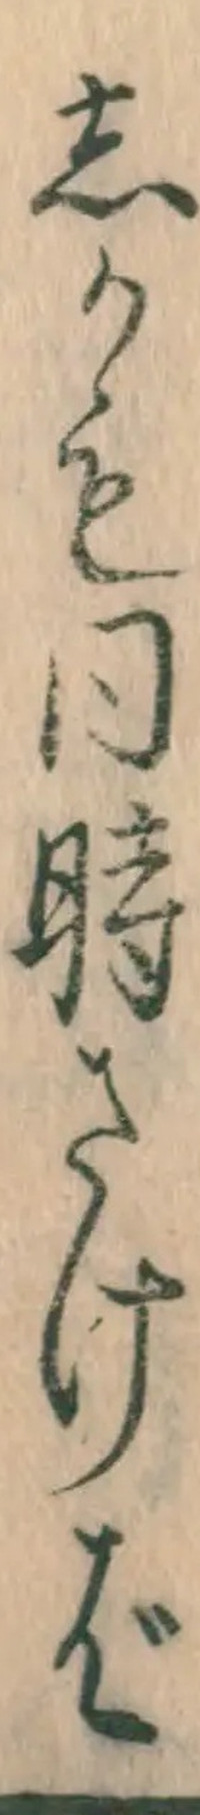しかも同時さけば
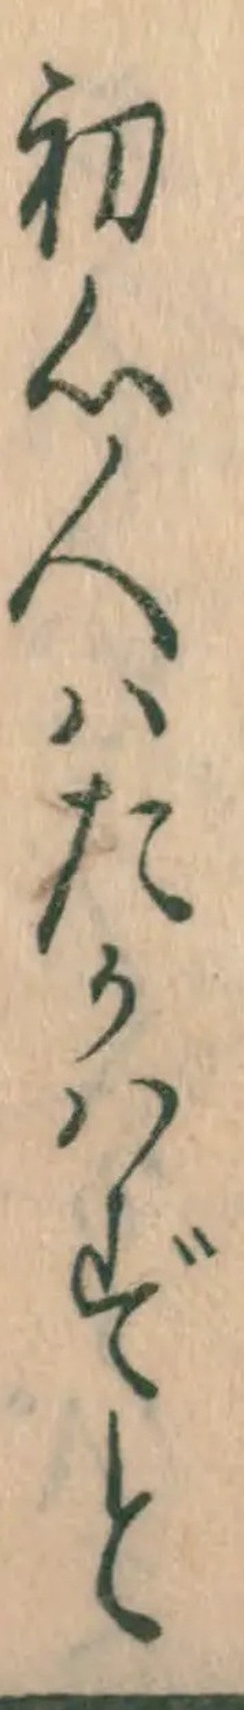初心人はたかはずと
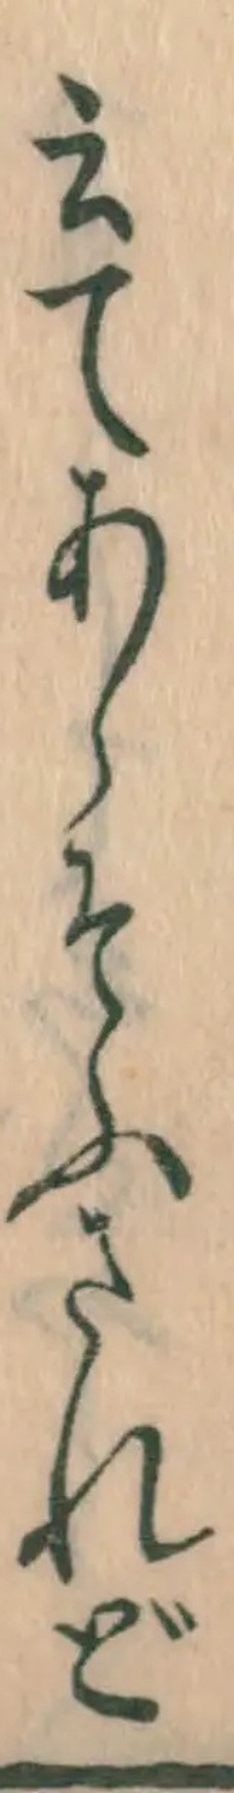云てあらそふされど
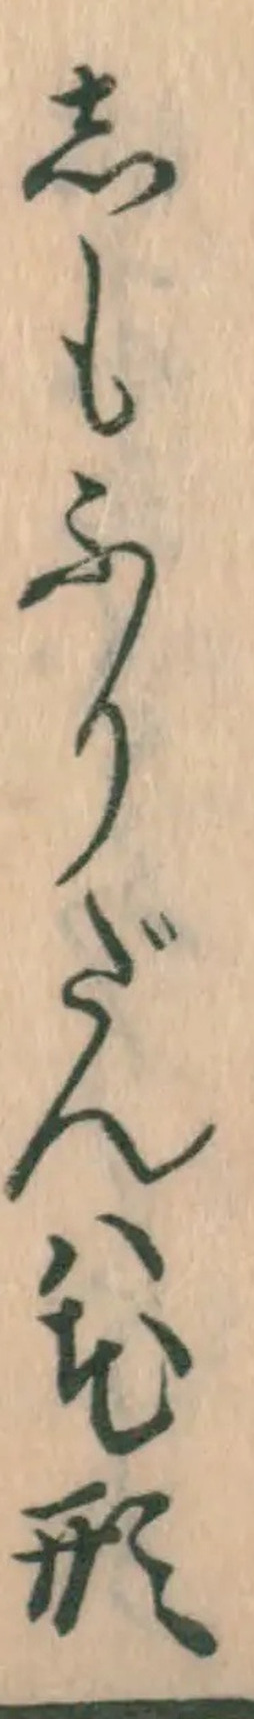しもふりだんは花形
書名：錦繍枕 5巻. [2]
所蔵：国立国会図書館 National Diet Library, JAPAN
